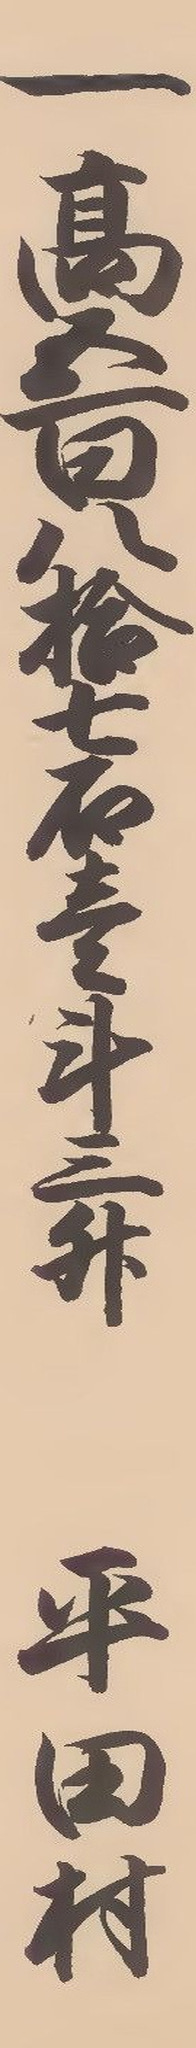一髙五百八拾七石壱斗三升平田村
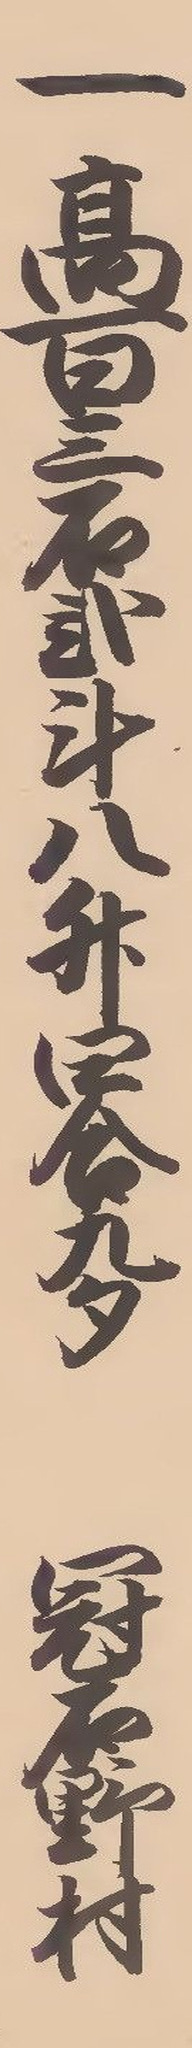一髙百三石弐斗八升四合九夕冠石野村

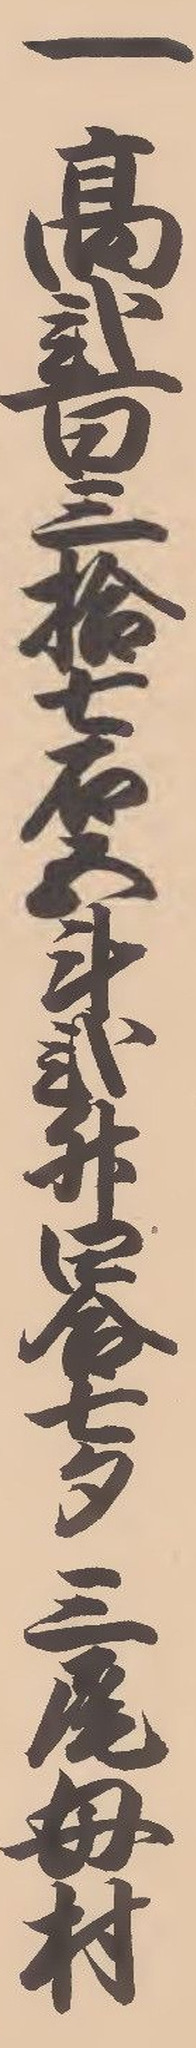一髙弐百三拾七石五斗弐升四合七夕三尾母村
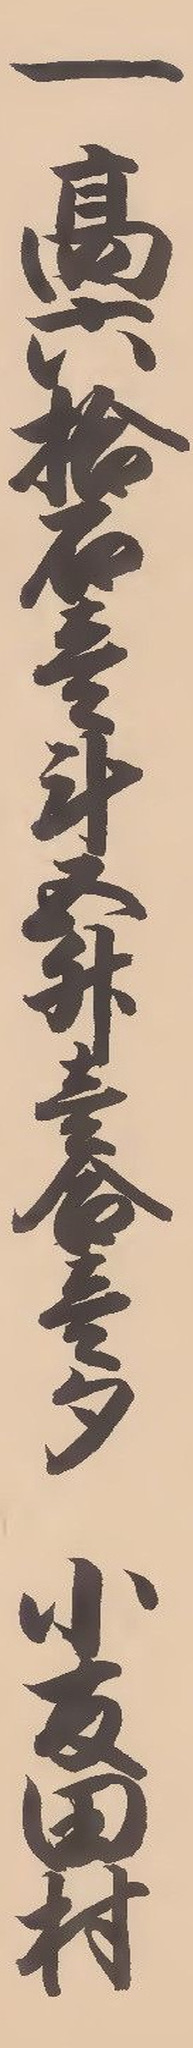一高六拾石壱斗五升壱合壱夕小友田村
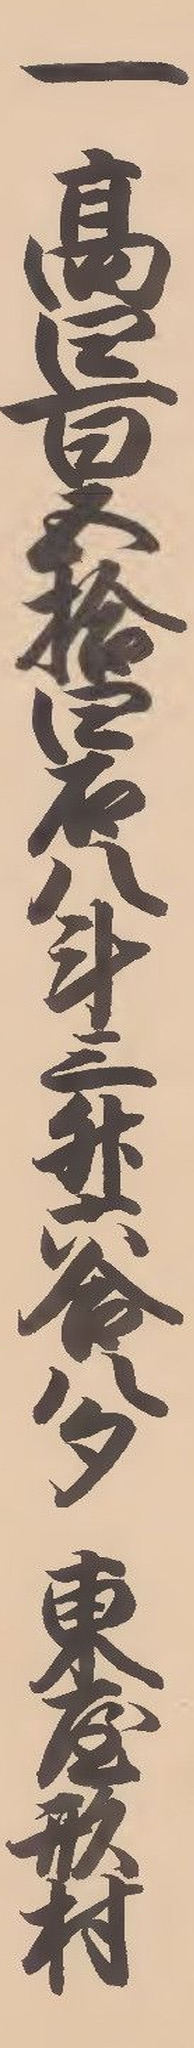一高四百五拾四石八斗三升六合八夕東屋形村
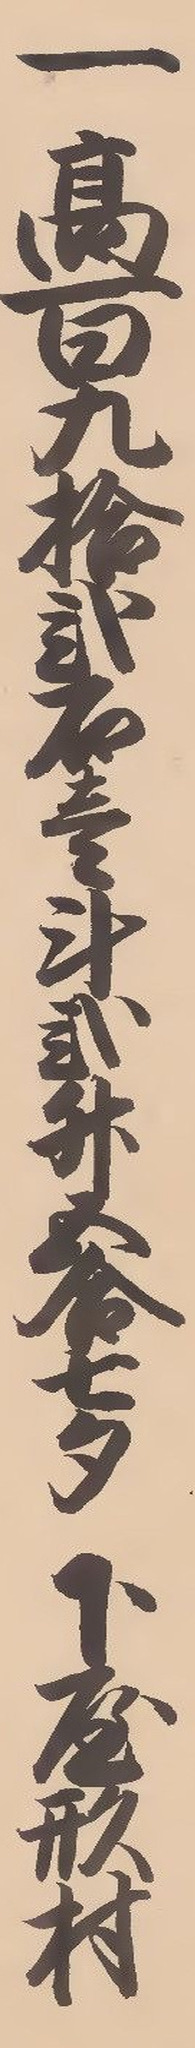一髙百九拾弐石壱斗弐升五合七夕下屋形村
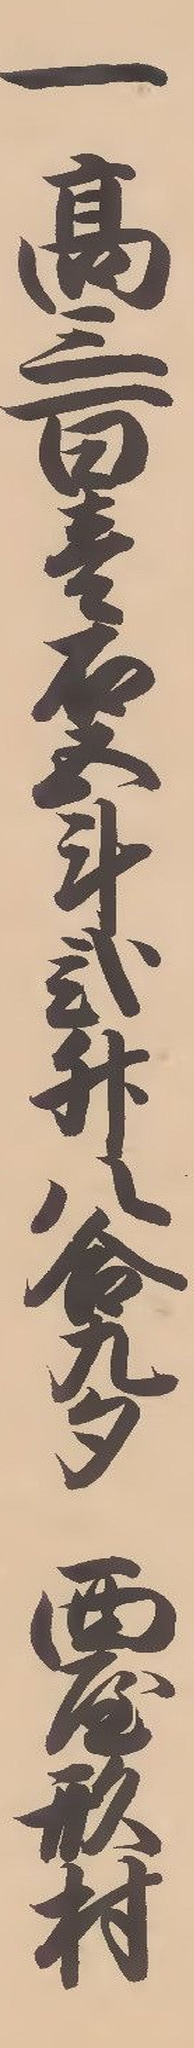一髙三百壱石五斗弐升八合九夕西屋形村
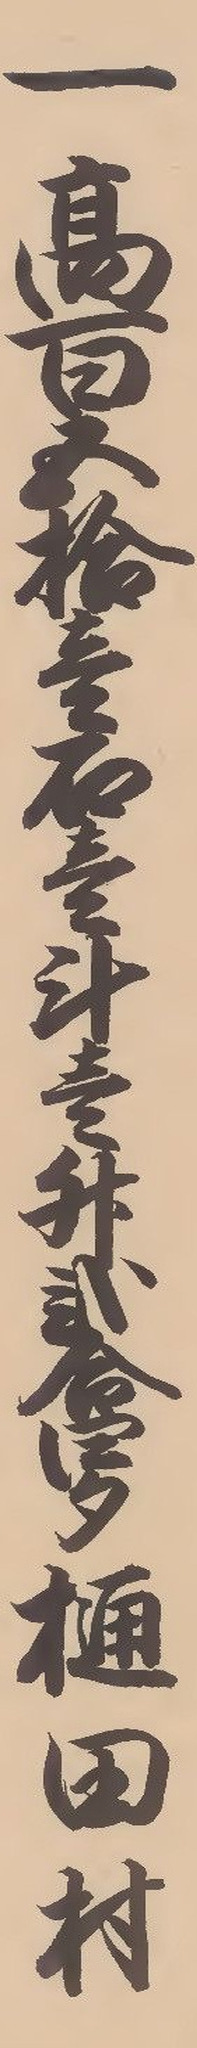一高百五拾壱石壱斗壱升弐合四夕樋田村
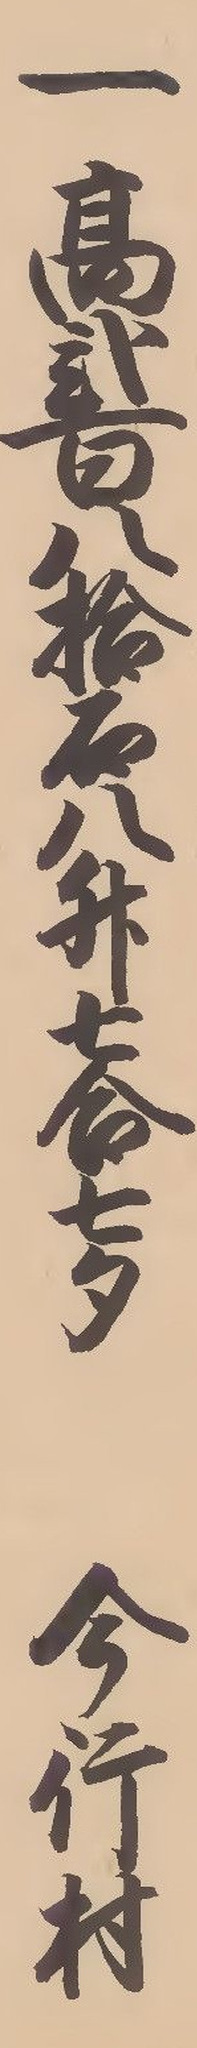一髙弐百八拾石八升七合七夕今行村
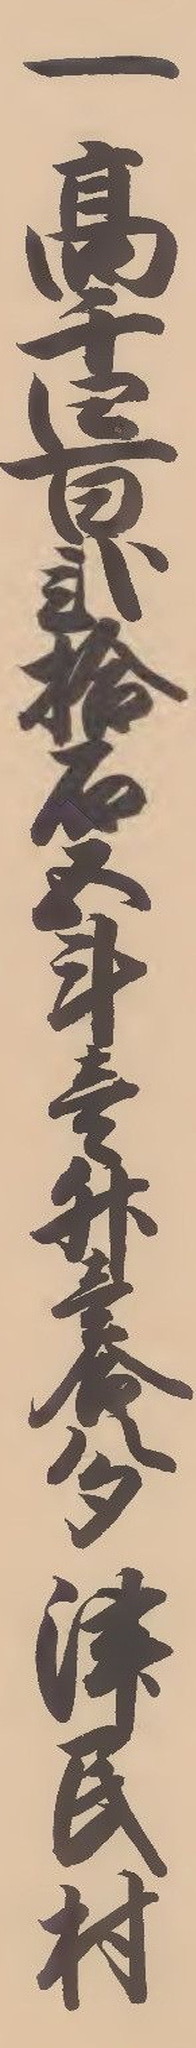一高千四百弐拾石五斗壱升壱合八夕津民村

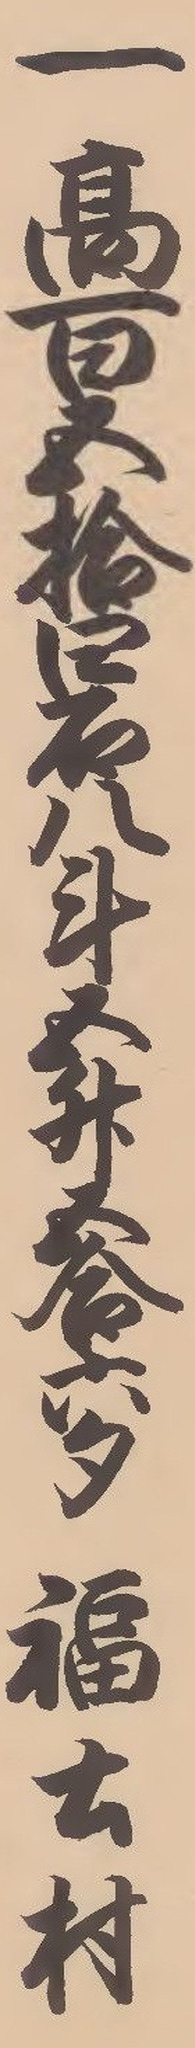一高百五拾四石八斗五升五合六夕福土村
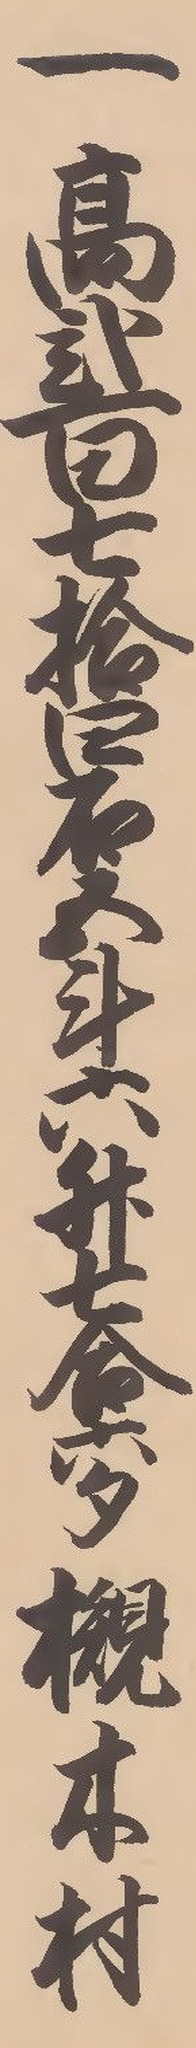一髙弐百七拾四石五斗六升七合六夕槻木村
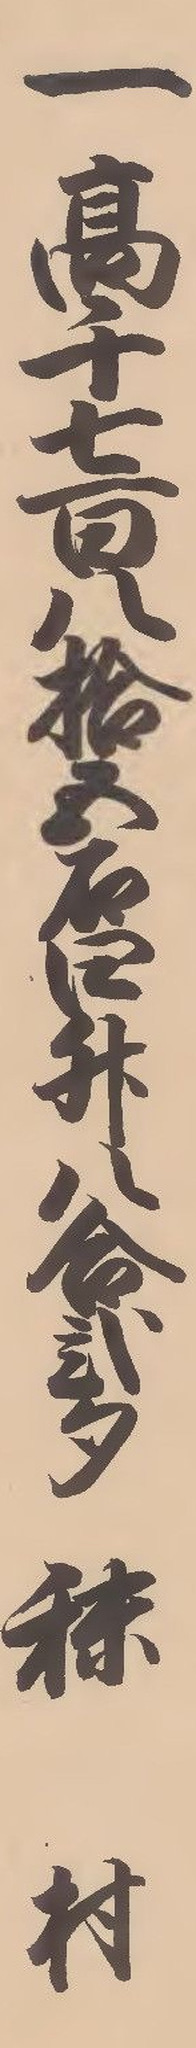一髙千七百八拾五石四升八合弐夕村
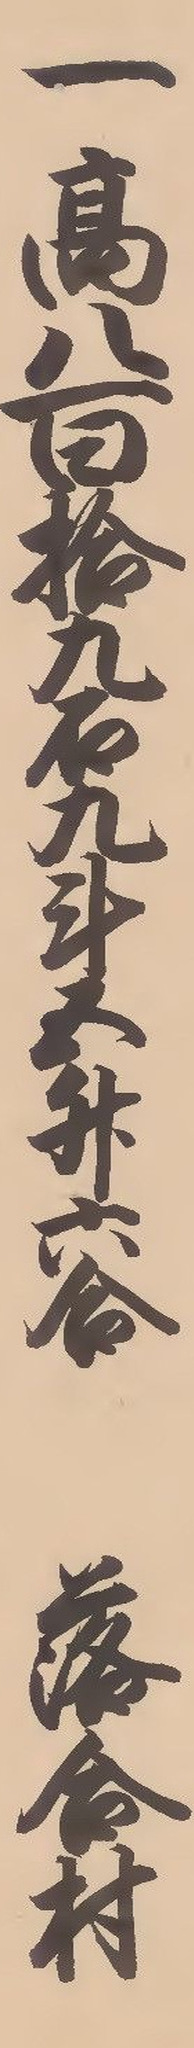一高八百拾九石九斗五升六合落合村
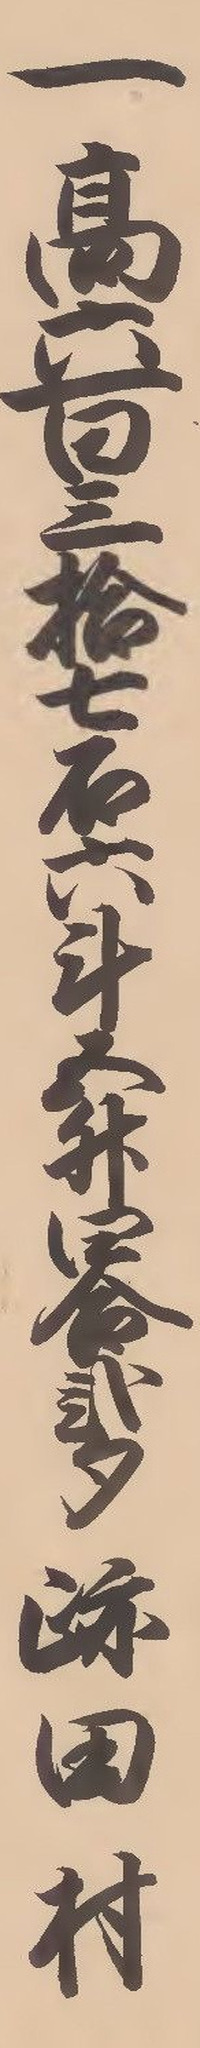一髙六百三拾七石六斗五升四合弐夕跡田村
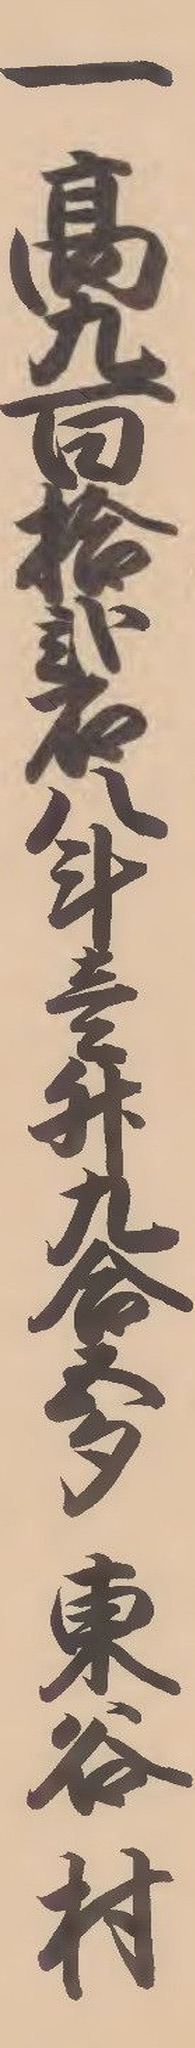一髙九百拾弐石八斗壱升九合五夕東谷村
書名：豊前国郷帳
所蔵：国立公文書館 National Archives of Japan
